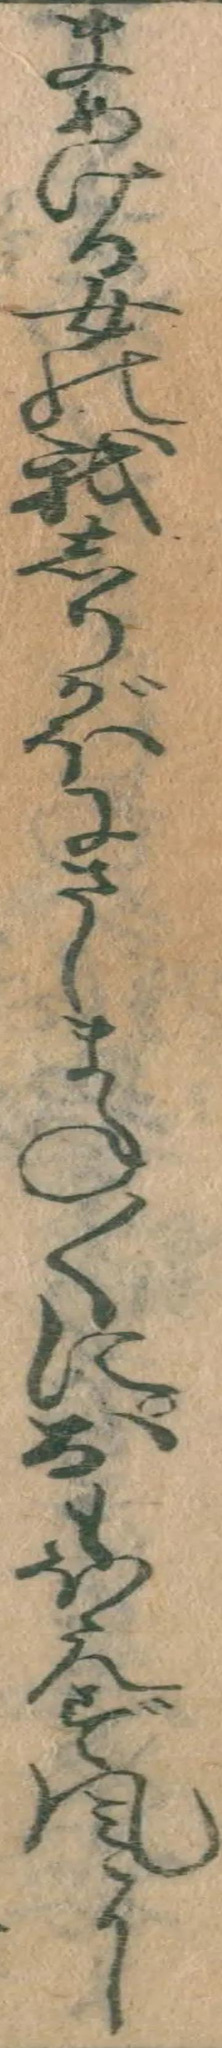まめける女の我しりがほにさしまね〱に。おもほえず風に
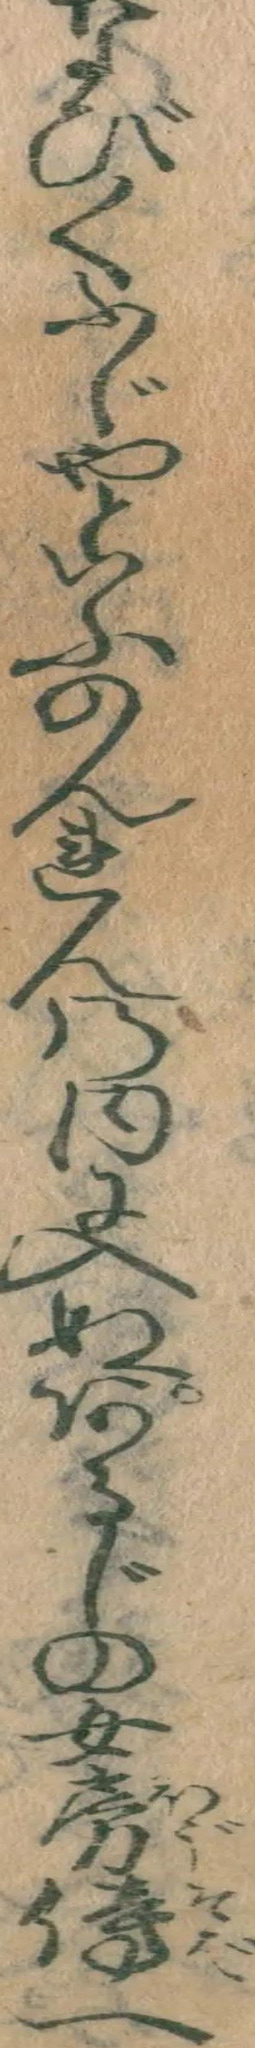なび〱ふじやといふのんれんの内に入ぬ。あるじの女房傍へ
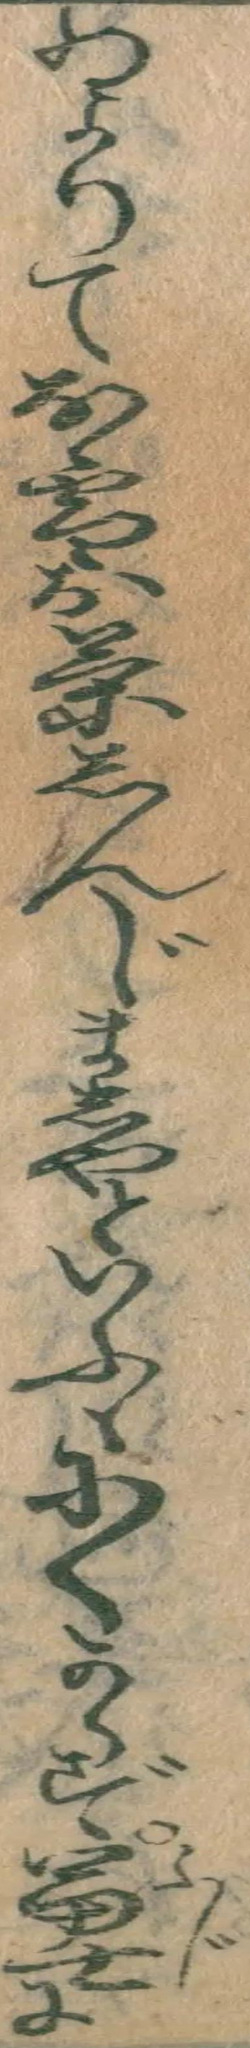ゐよりてお雪お茶しんじましやといふもにくからず。富士に
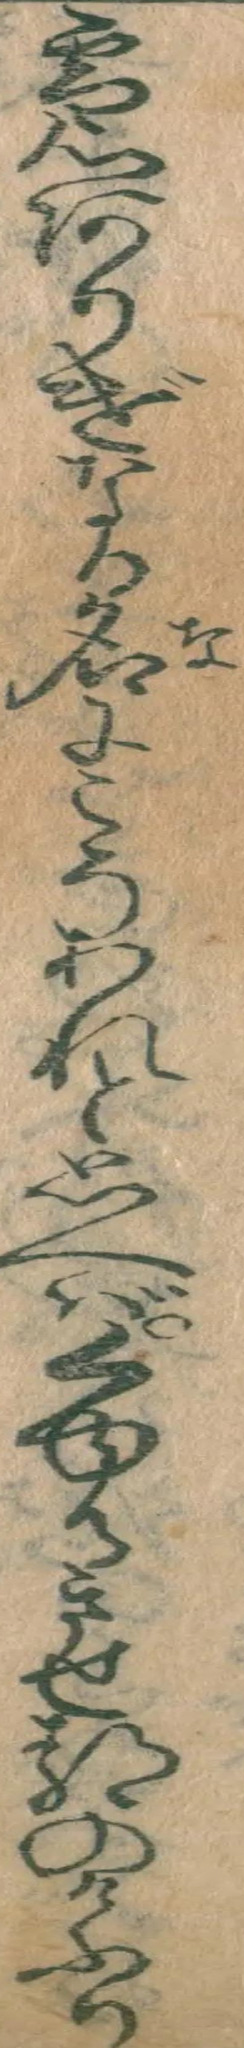雪心ありげなる名にこそあれと思へば。くゆるきせるのけふり
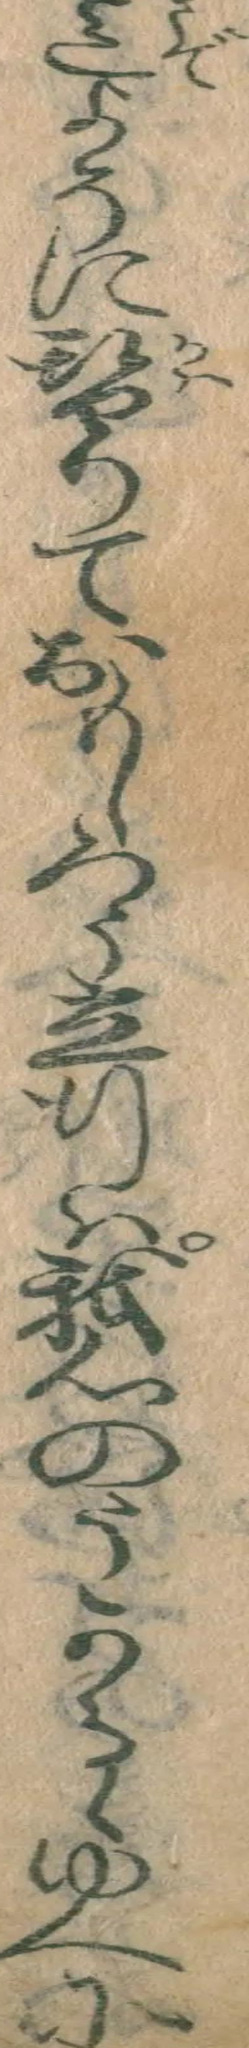迄よそに替りておもしろう立行は。我心のうかるゝゆへに
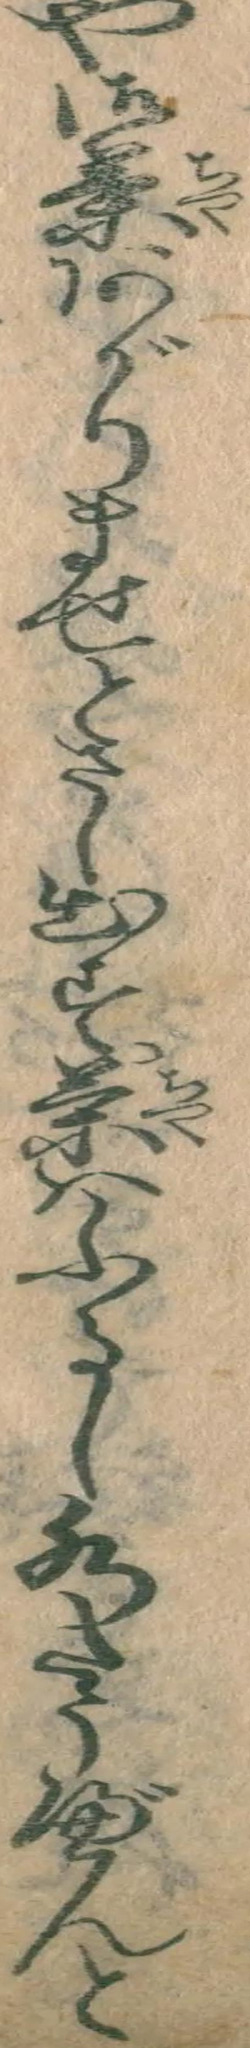や御茶あがりませとさし出す茶はふるし水たうべんと
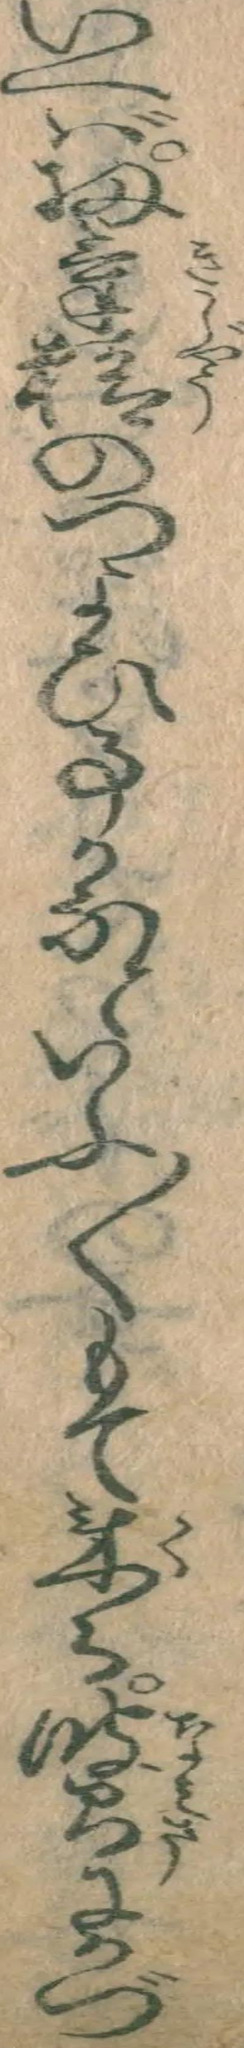いへば。扨気精のつよひ事かなといふ〳〵もて来る。波間にかづ
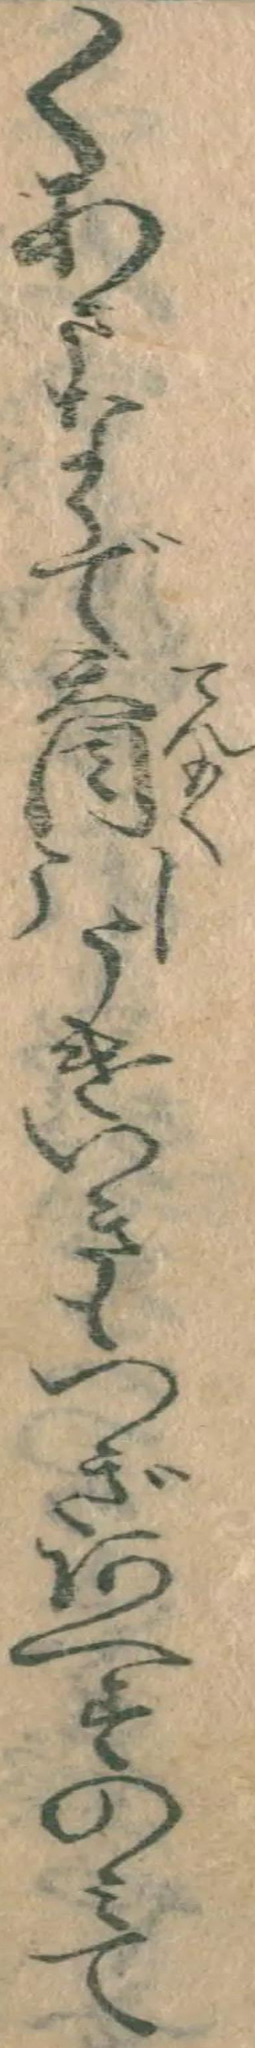〳〵あまならで天目引うけいきもつぎあへすのみて

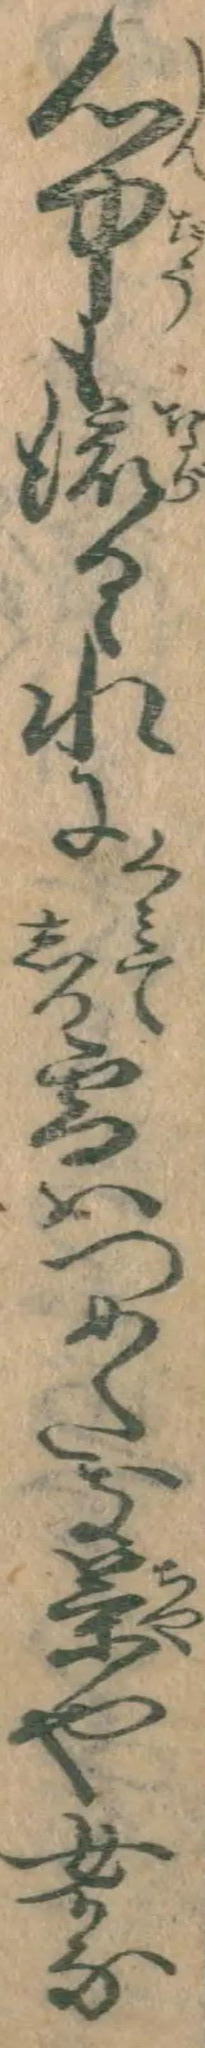心中も流るゝ水にくみてしる雪はつめたき茶や女かな
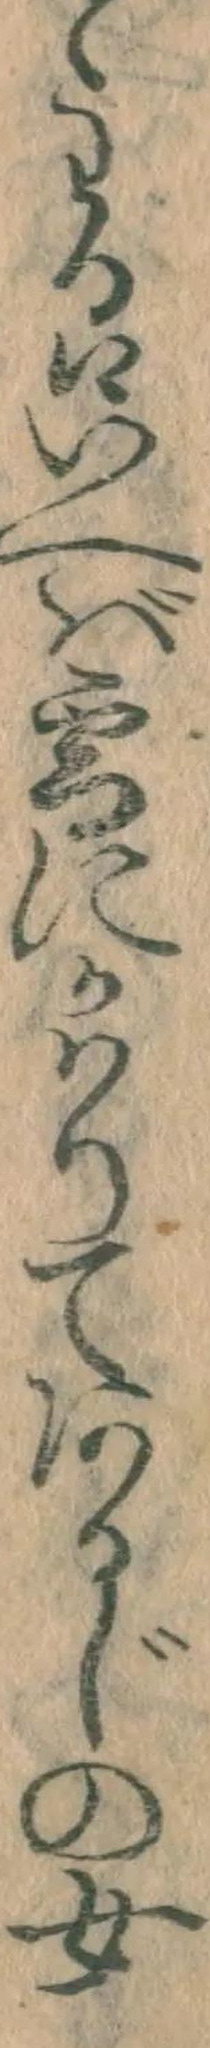とわる口いへば雪にかはりてあるじの女
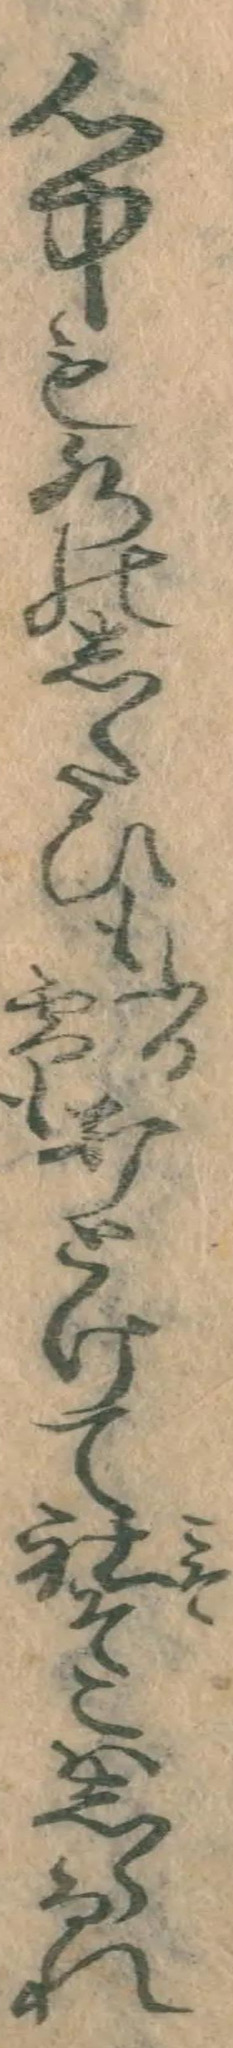心中も水のしたひもふる雪も打とけて社そこはしらるれ
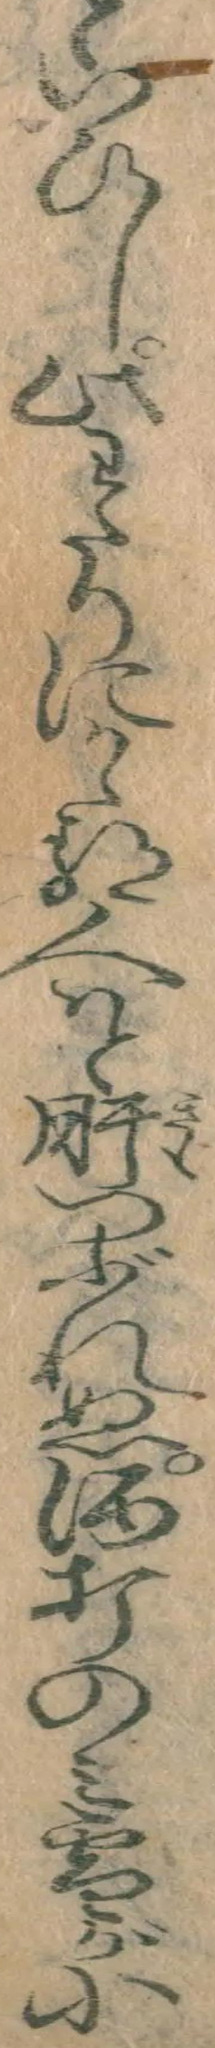といひし。此わたりにかゝる人はと肝つぶれぬ。酒打のみ雪が小
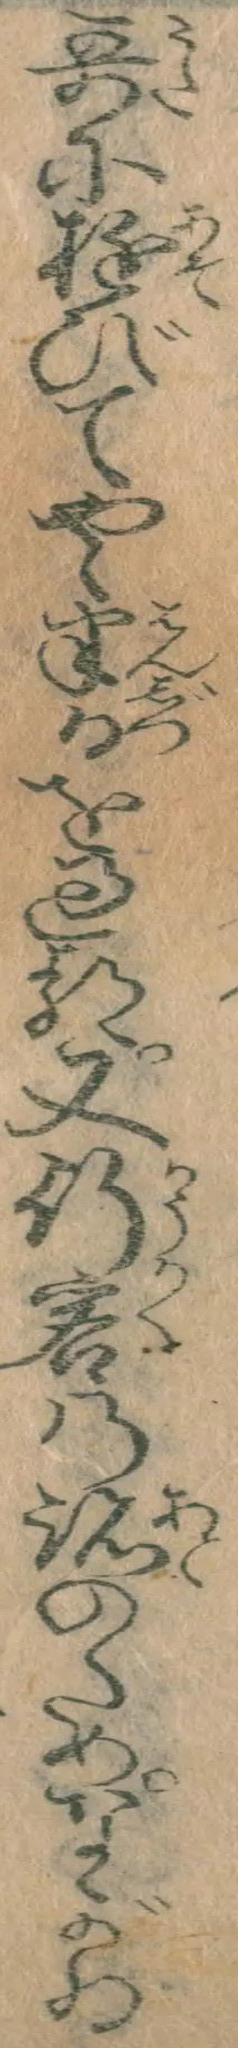歌に遊びてやゝ半日を過る。又行客の跡のため。ながゐ
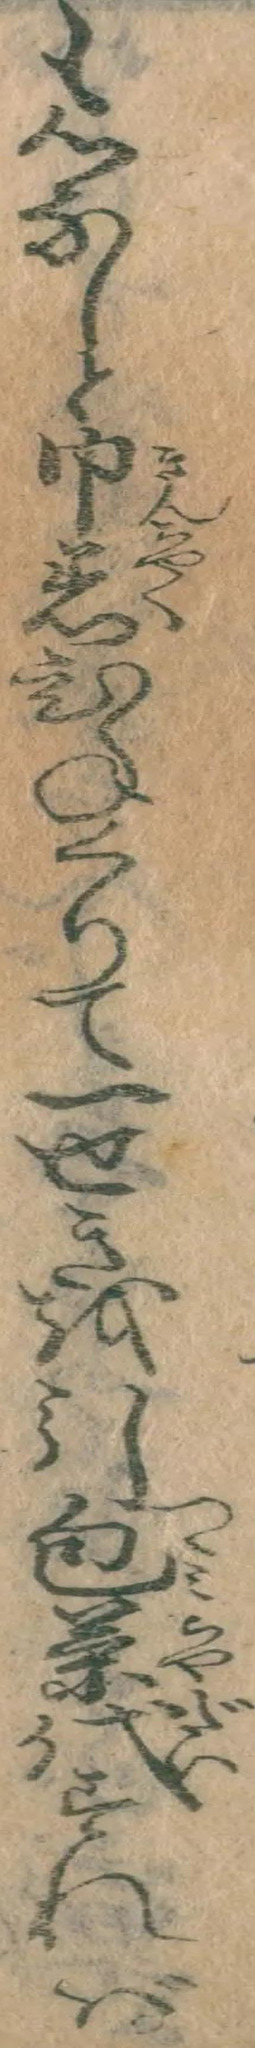も心なしと巾着ひねくりて一せきを引包茶代すれば
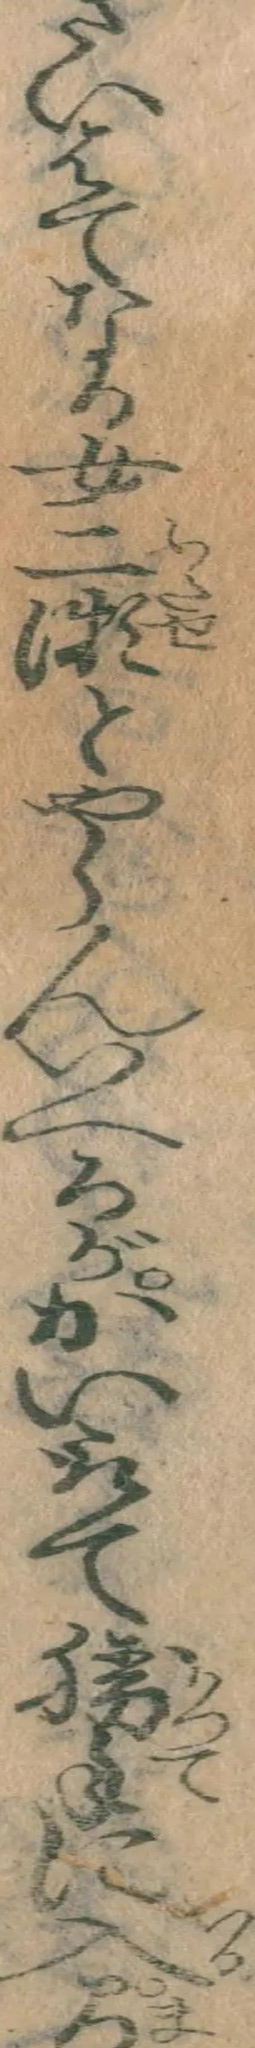さいはてなる女二瀬とやらんいへるが。かい取て勝手に入。間
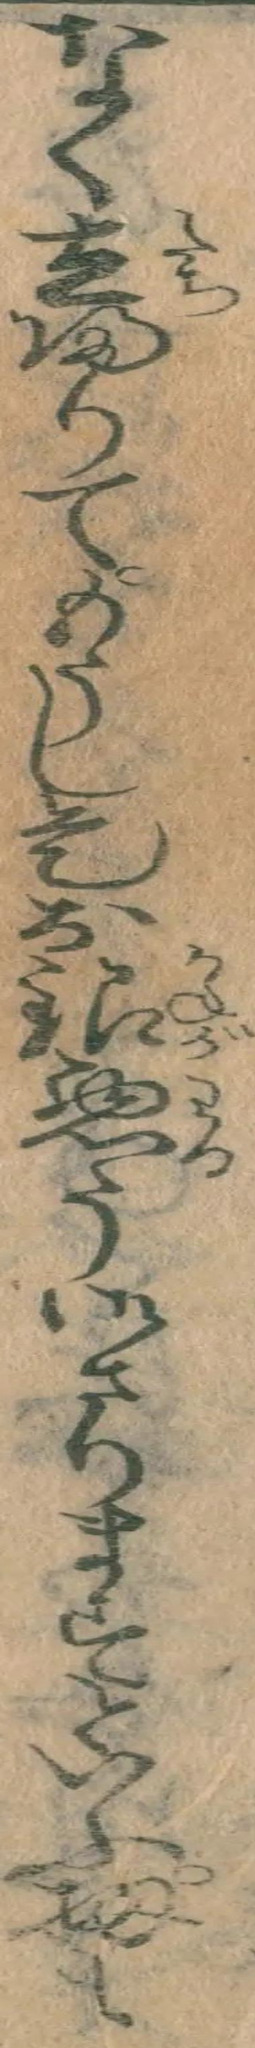なく去帰りて。もうし是お銀悪う御さりますといふ。扨も
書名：新竹斎 5巻
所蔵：国立国会図書館 National Diet Library, JAPAN
